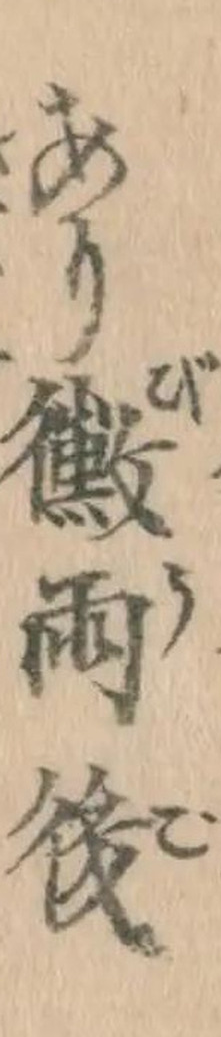あり黴雨後
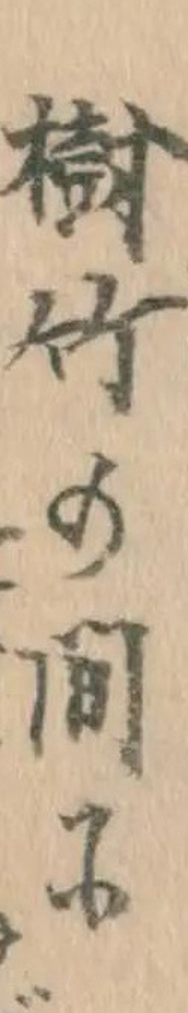樹竹の間に
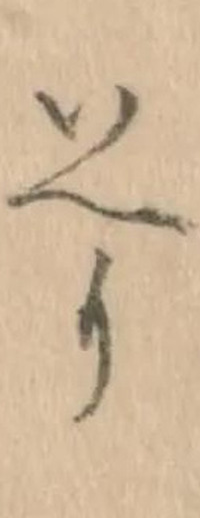いへり

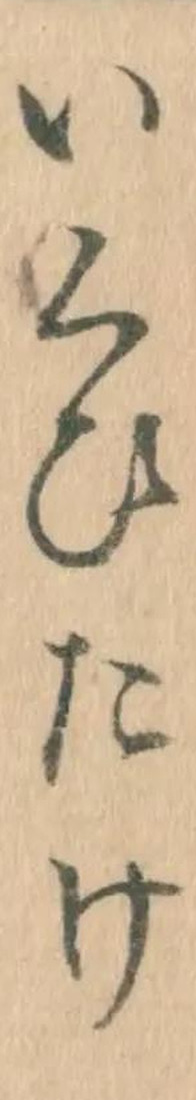いくひたけ
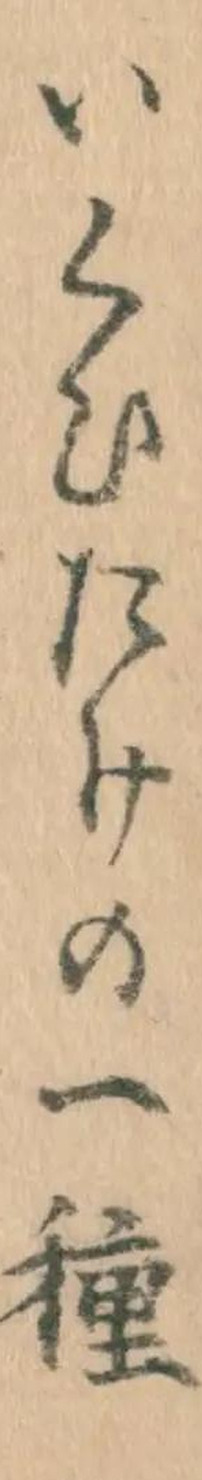いくひたけの一種
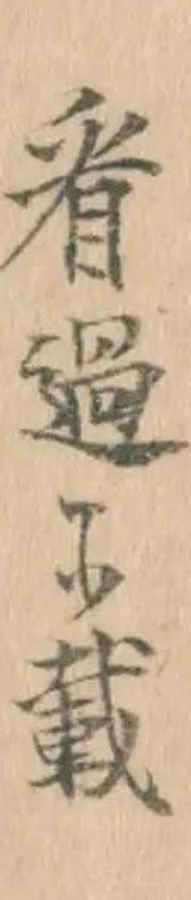看過に載
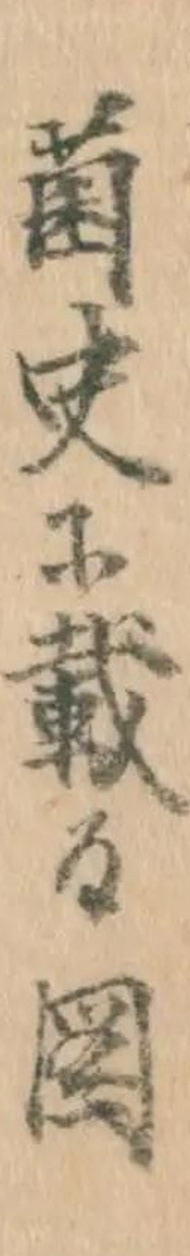菌史に載る図
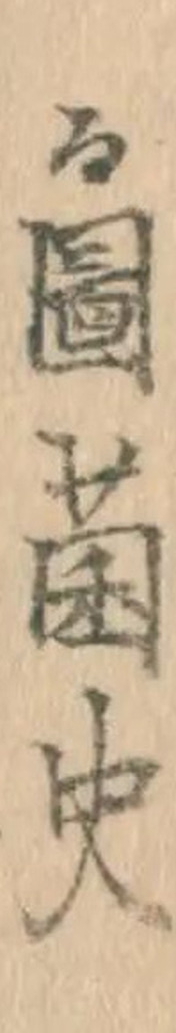る図菌史
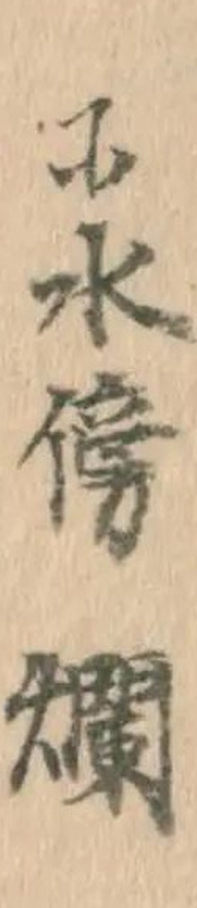に水傍爛
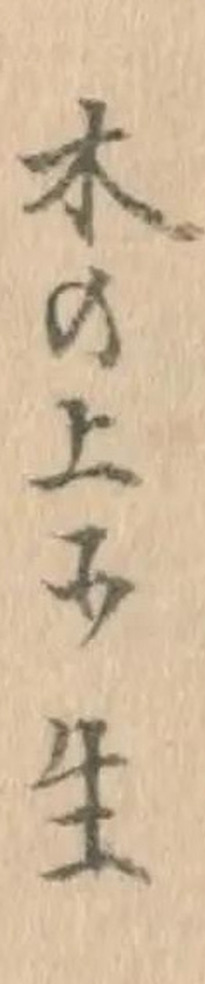木の上に生
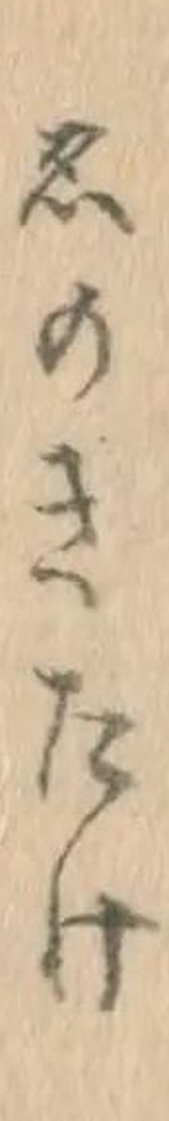ゑのきたけ
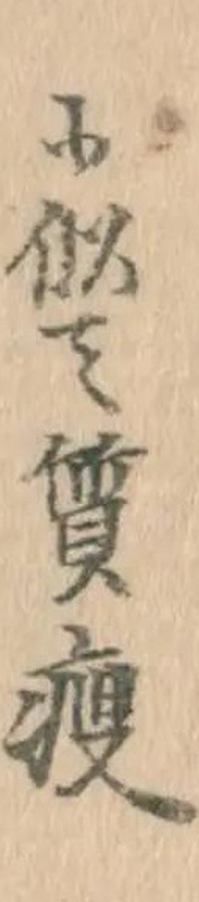に似て質痩
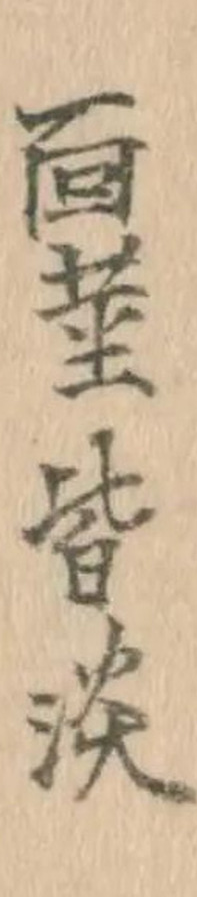面茎皆淡
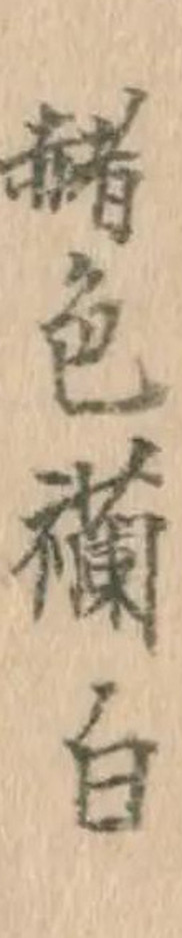赭色襽白
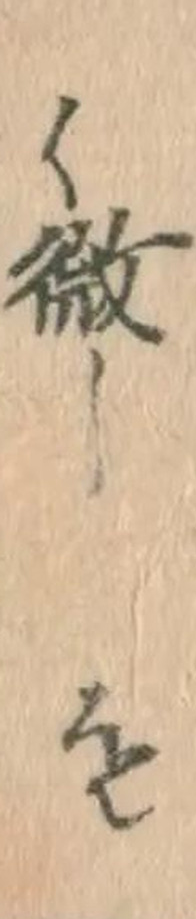く微しを
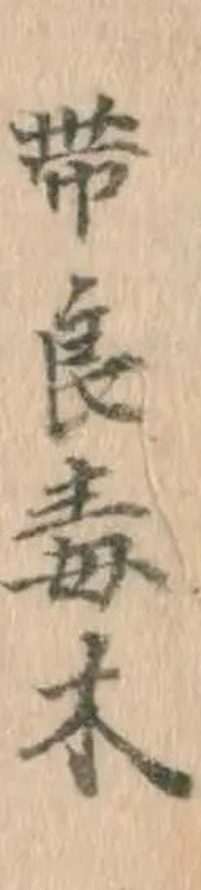帯良毒木
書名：本草図譜. 巻58-60
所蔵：国立国会図書館 National Diet Library, JAPAN
